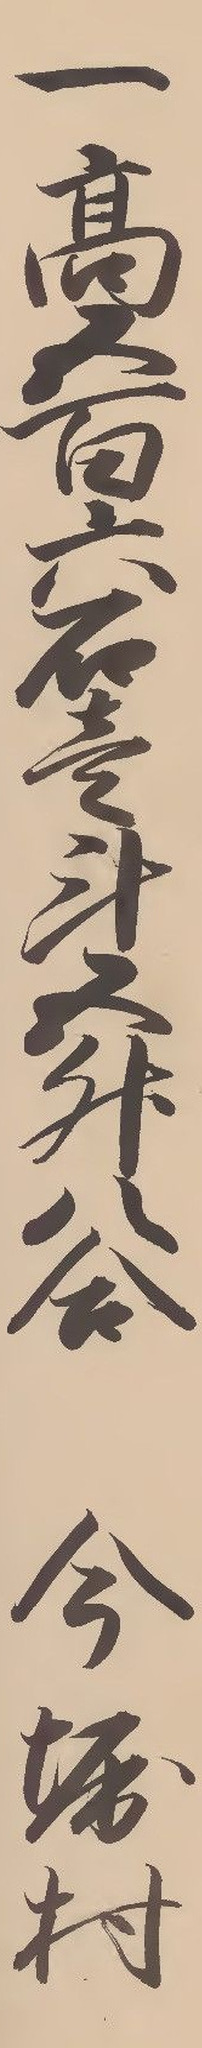一高五百六石壱斗五升八合今堀村
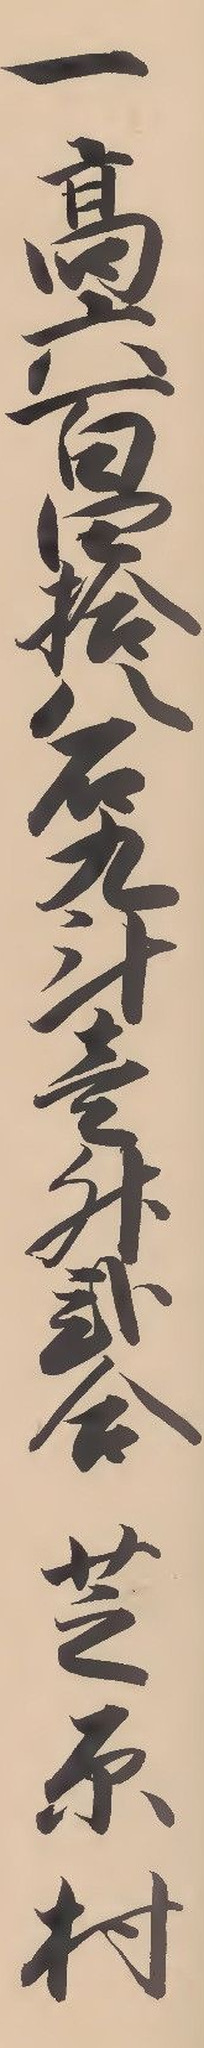一高六百四拾八石九斗壱升弐合芝原村
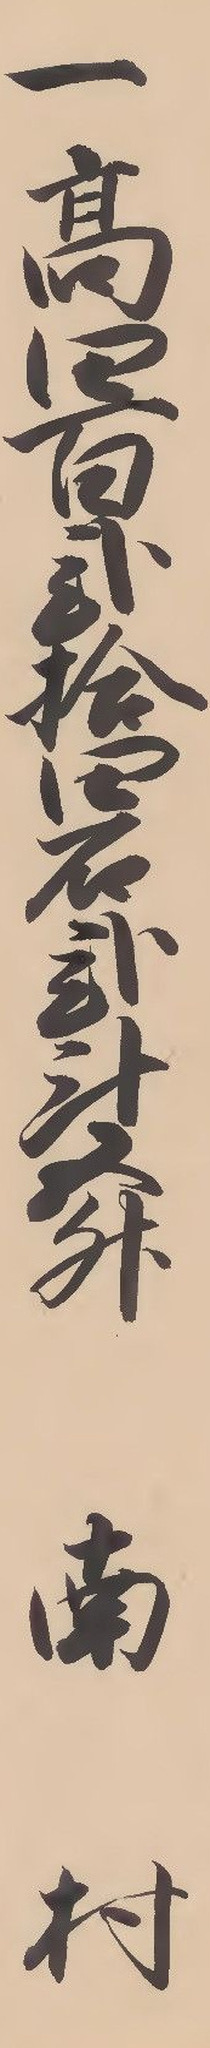一高四百弐拾四石弐斗五升南村
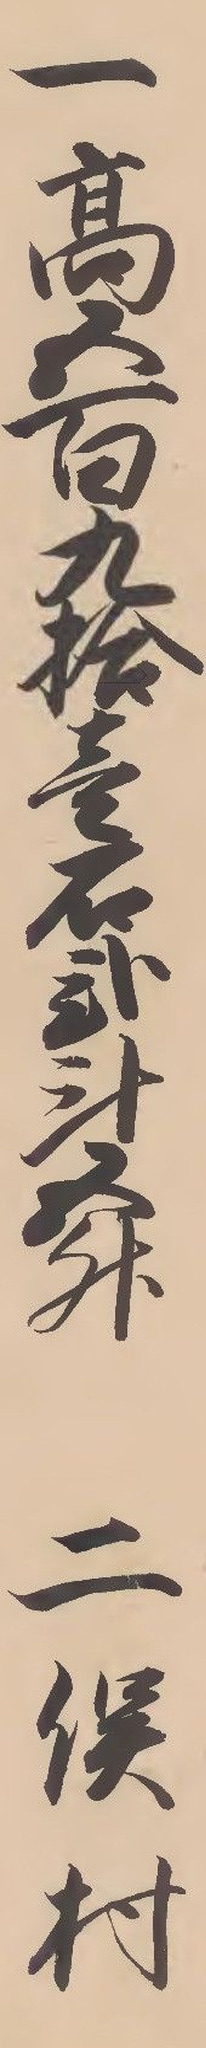一高五百九拾壱石弐斗五升二俣村
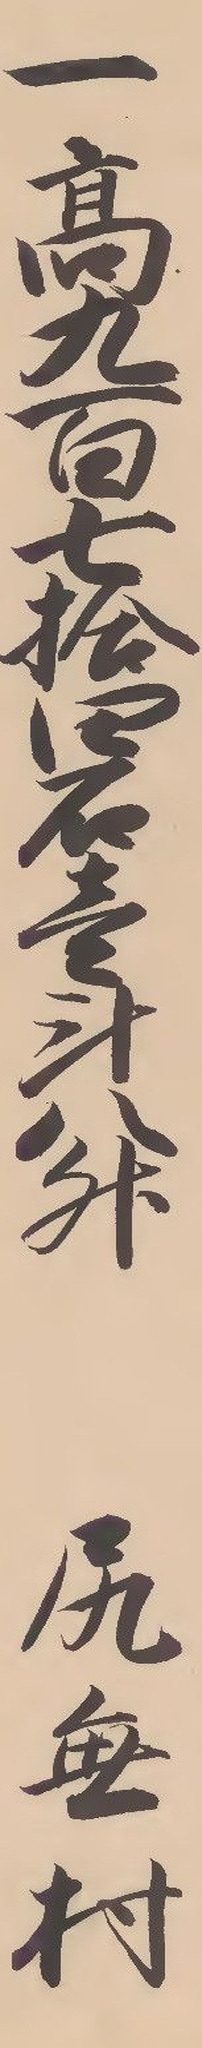一高九百七拾四石壱斗八升尻無村

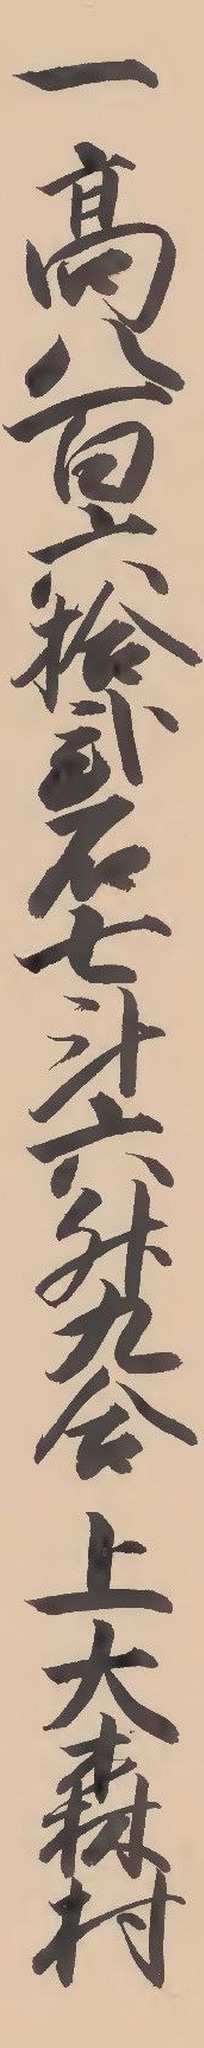一高八百六拾弐石七斗六升九合上大森村
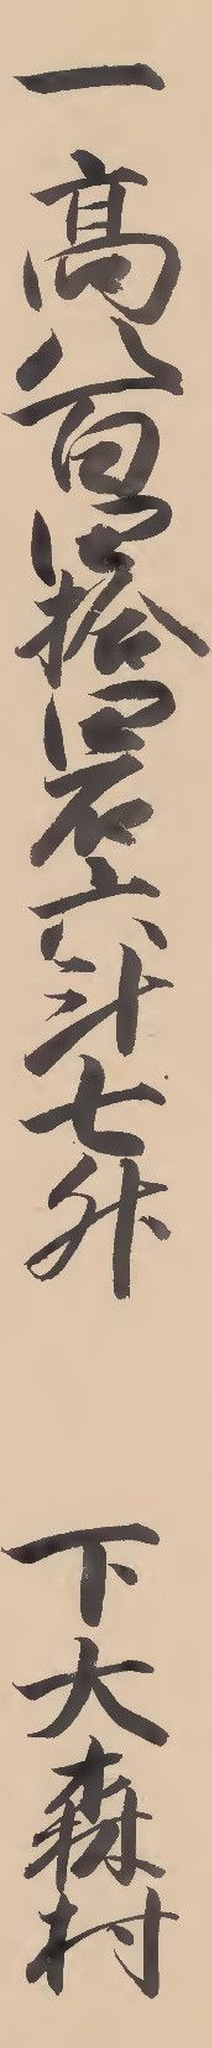一高八百四拾四石六斗七升下大森村
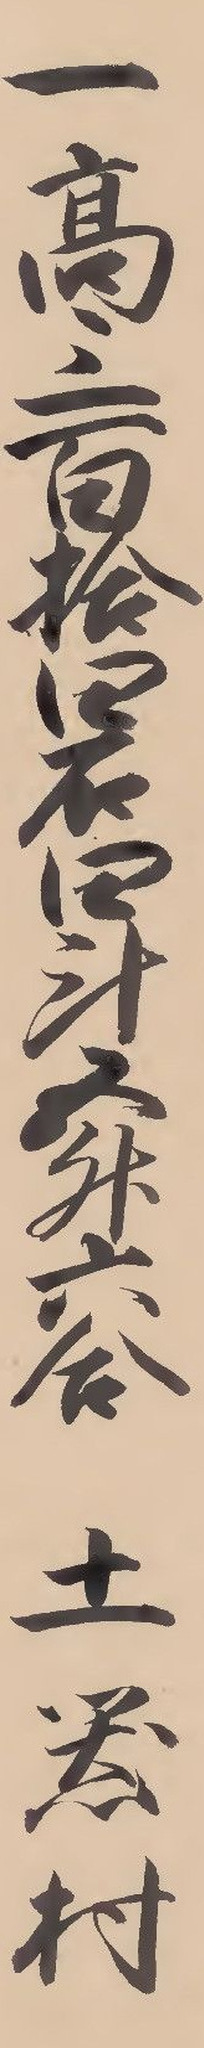一高三百拾四石四斗五升六合土器村
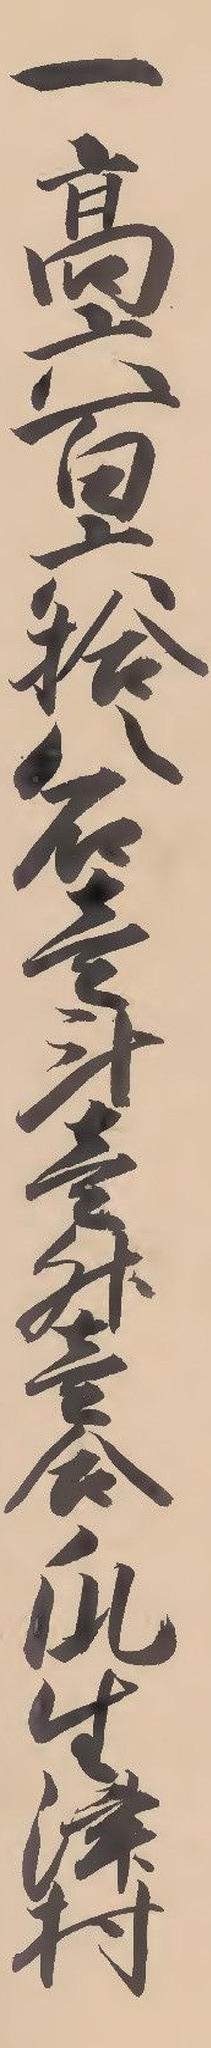一高六百六拾八石壱斗壱升壱合瓜生津村
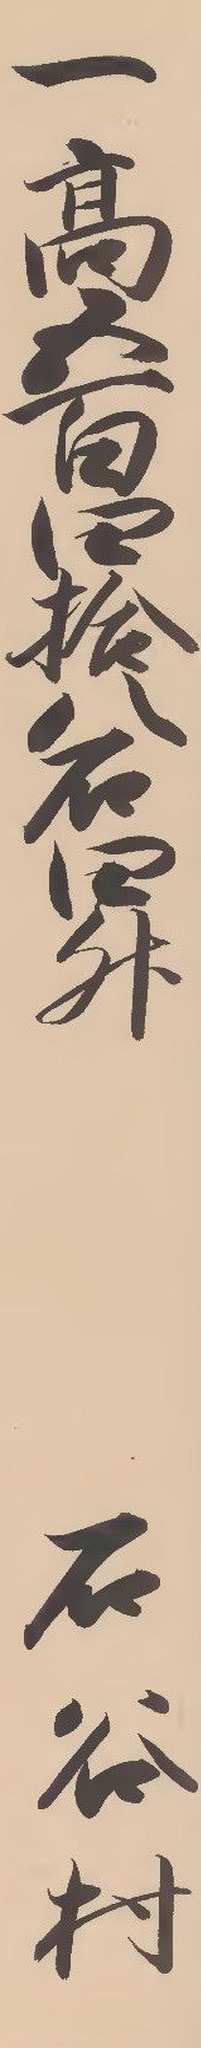一高五百四拾八石四升石谷村
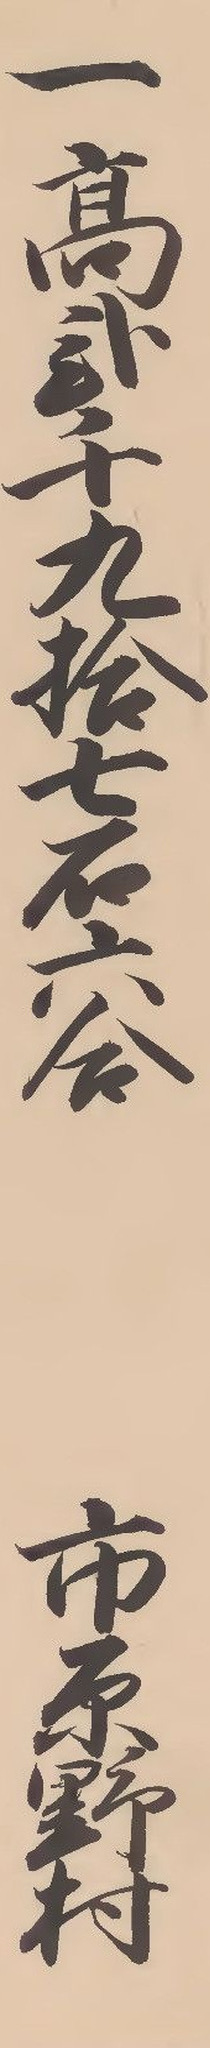一高弐千九拾七石六合市原野村

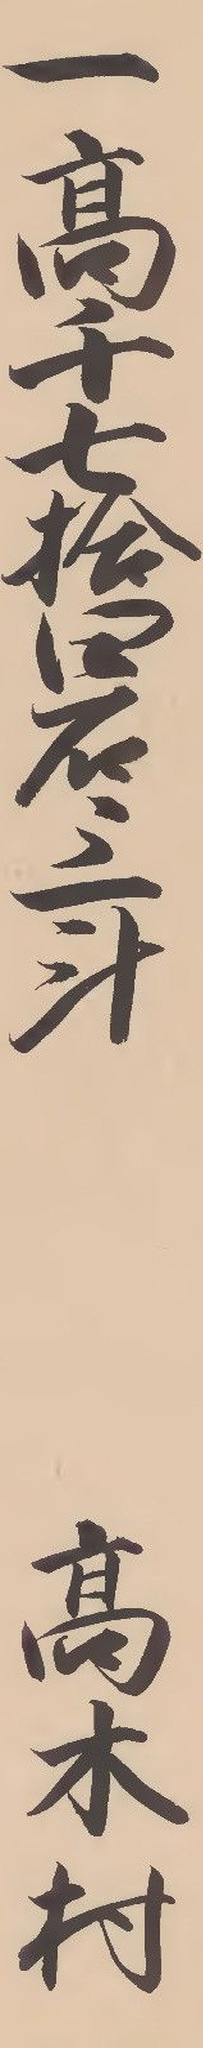一高千七拾四石三斗高木村
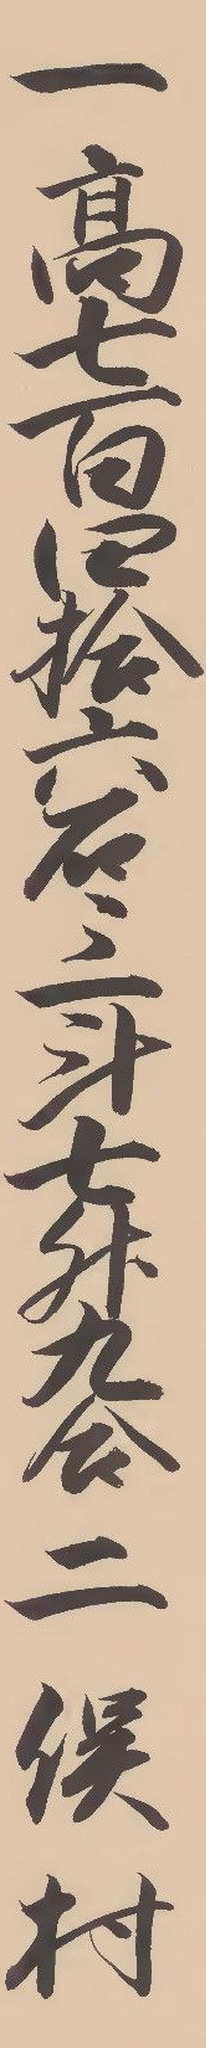一高七百四拾六石三斗七升九合二俣村
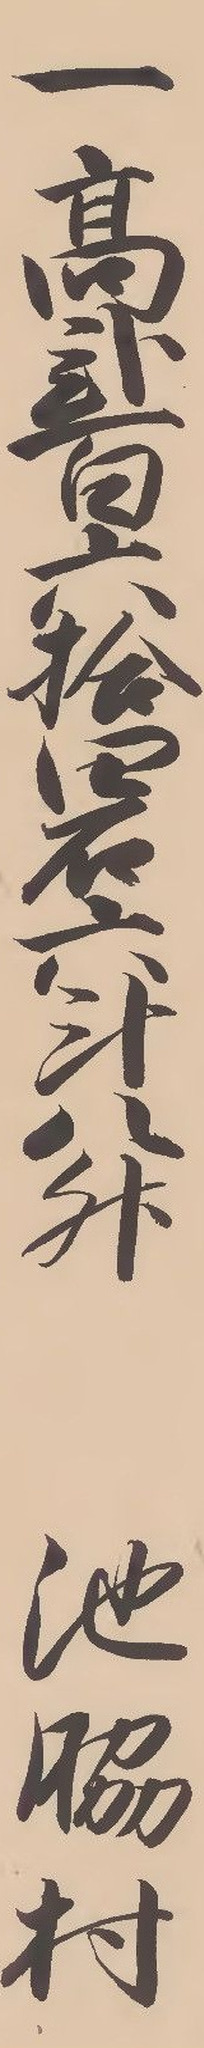一高弐百六拾四石六斗八升池脇村
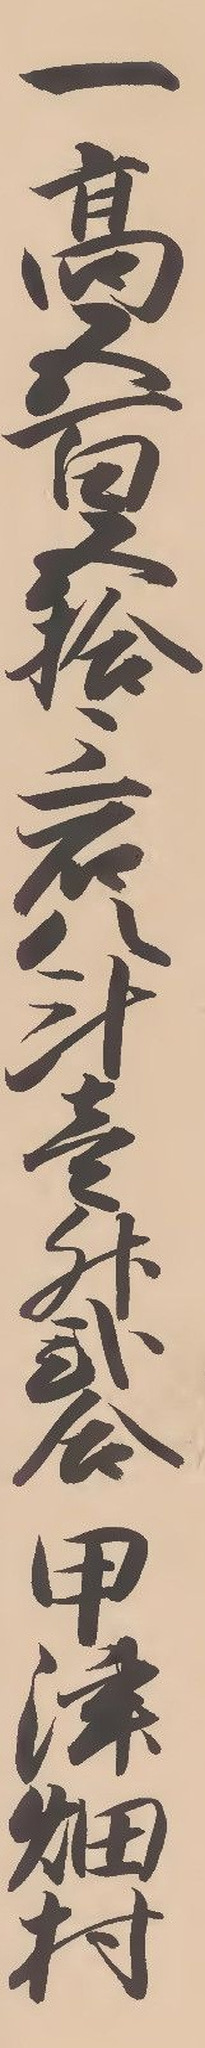一高五百五拾三石八斗壱升弐合甲津畑村
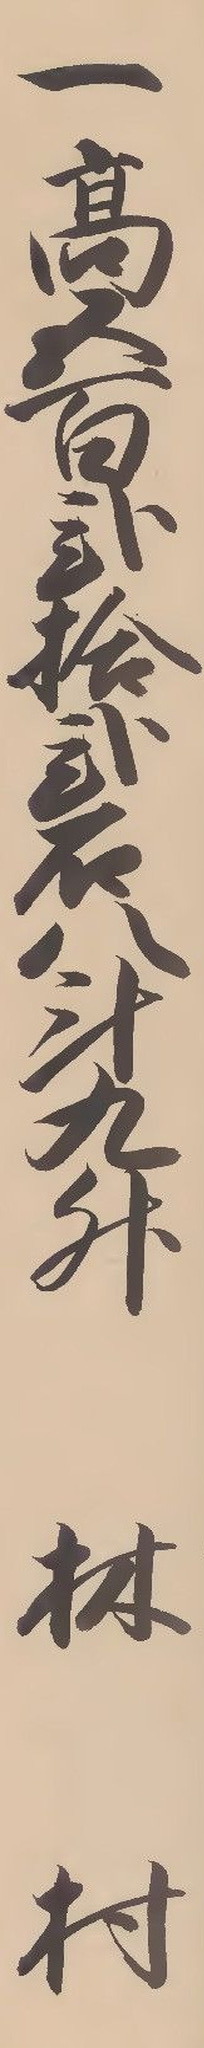一高五百弐拾弐石八斗九升林村
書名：近江国郷帳
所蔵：国立公文書館 National Archives of Japan
